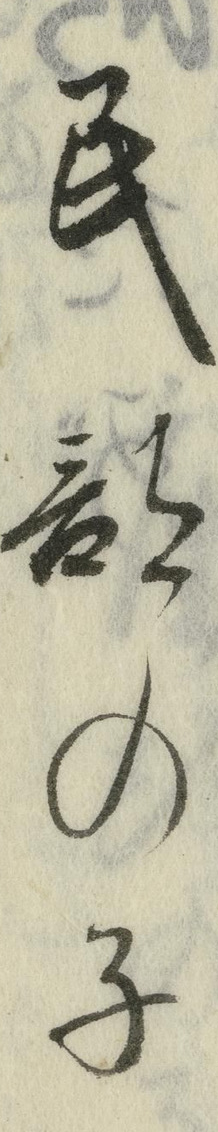民部の子

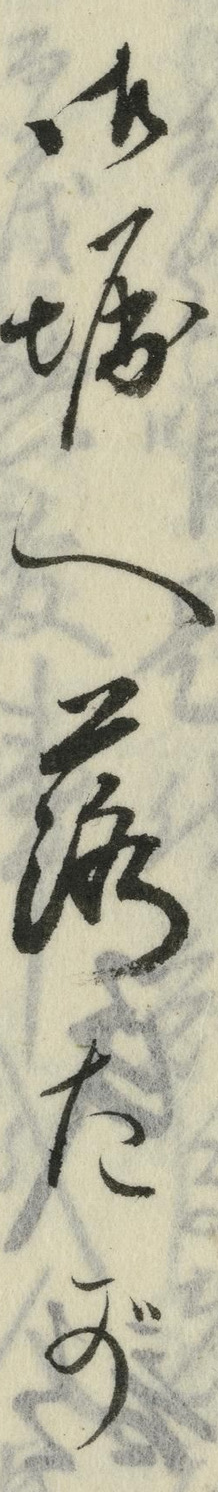御堀へ落ちたが
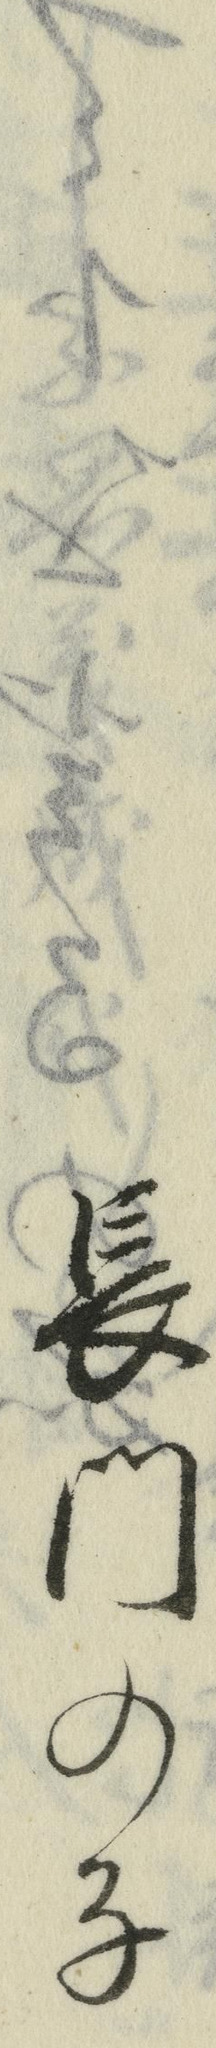長門の子
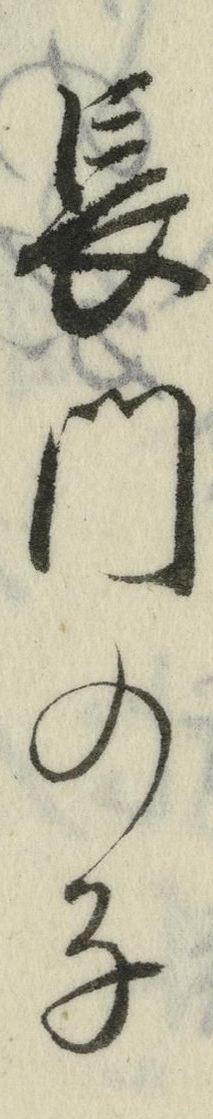長門の子
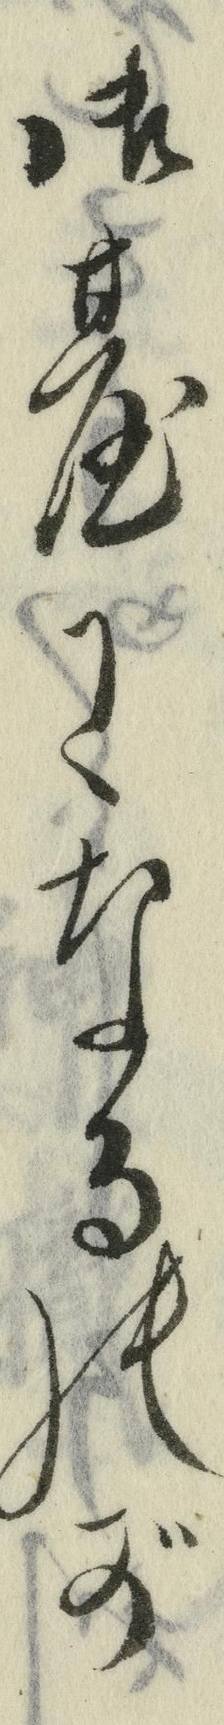御台になるのが
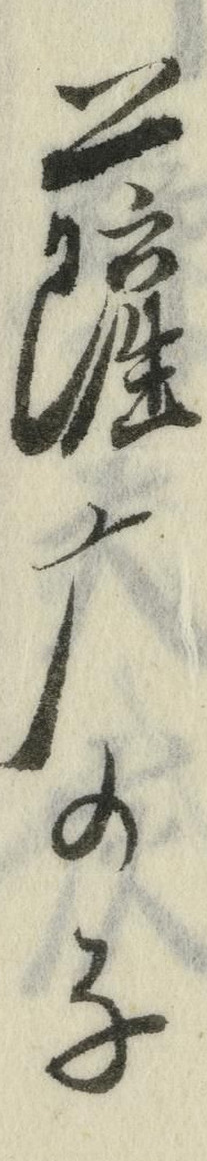薩摩の子
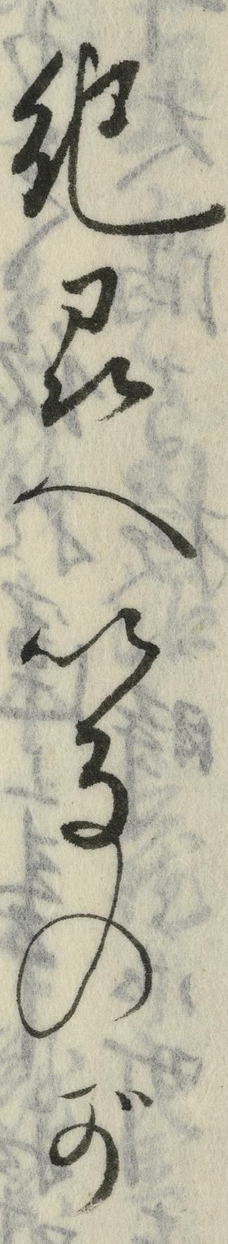紀州へいるのが
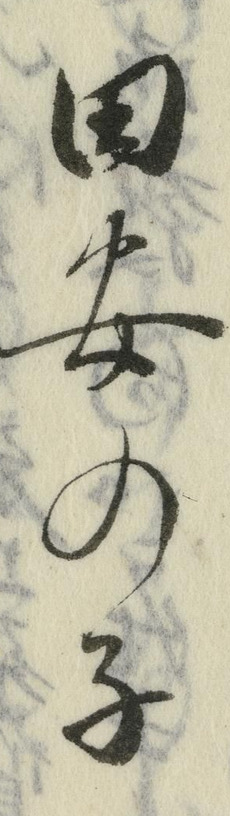田安の子
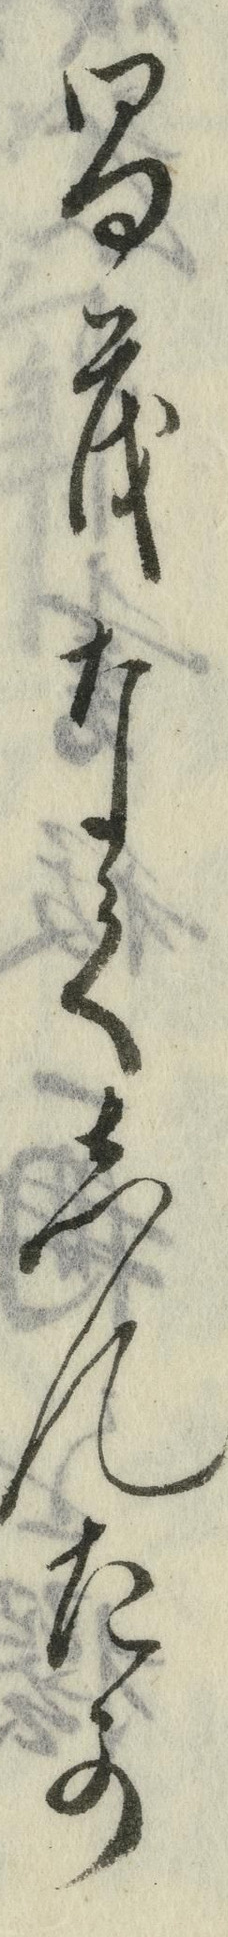間茂なくしんたか
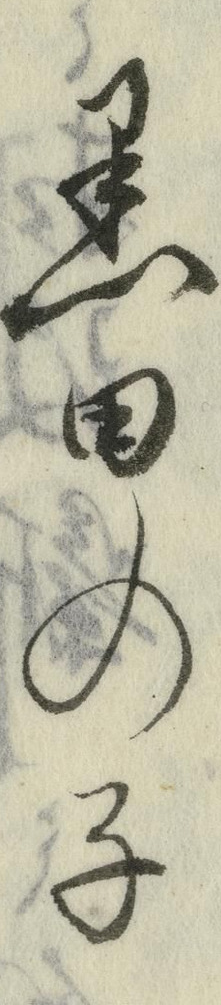黒田の子
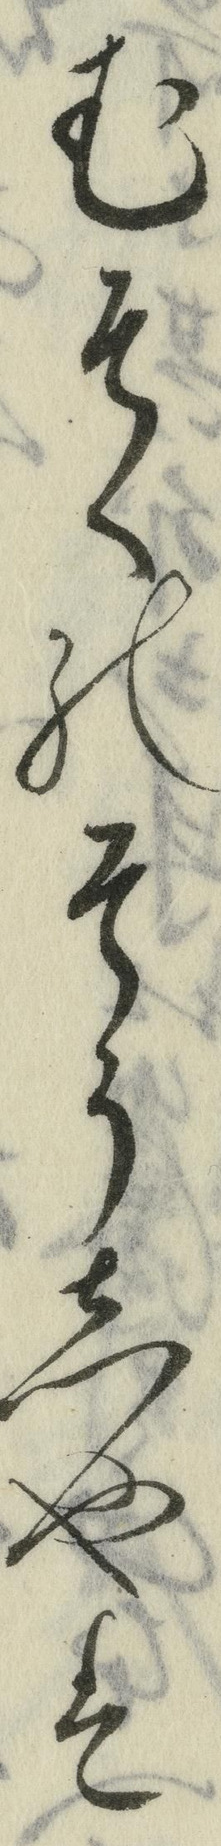むそくのそうしゃは
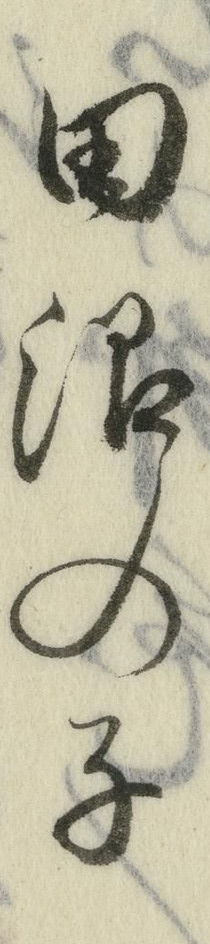田沼の子
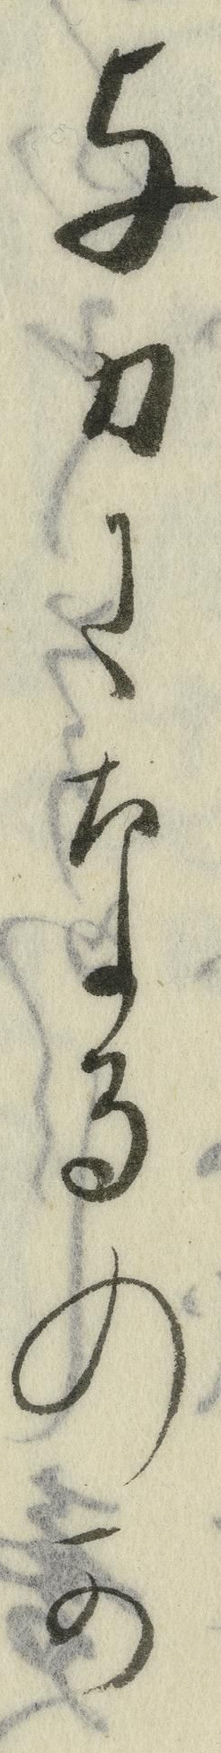与力になるのか
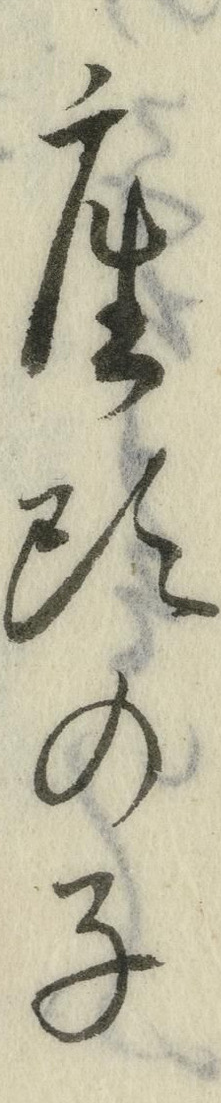座頭の子
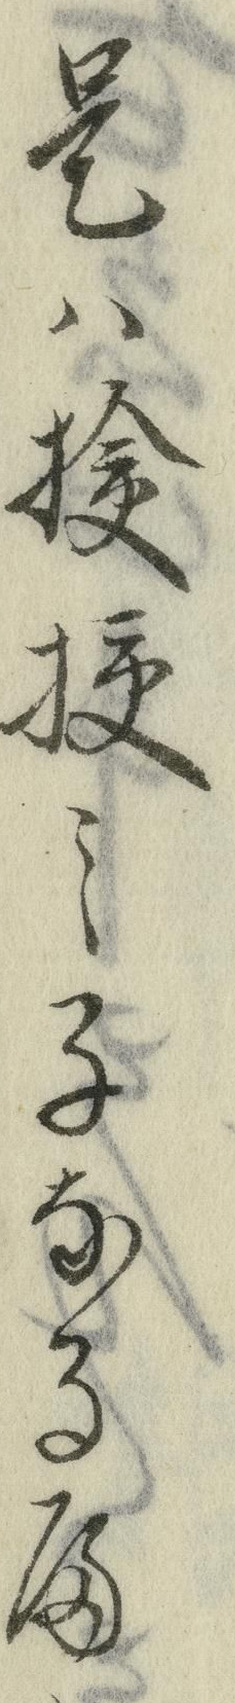是は検校之子なるべし

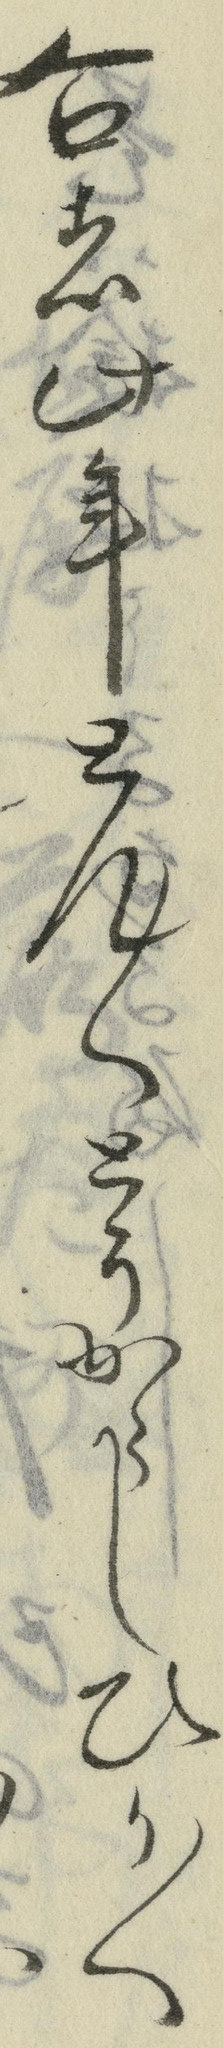右は此年とん〳〵とうからしひり〳〵
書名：天明三癸卯七月信州浅間山焼出シ上州山津浪ニ付近國ヨリ御届書并訴書写
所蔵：東京大学地震研究所図書室 Earthquake Research Institute Library, The University of Tokyo, JAPAN
